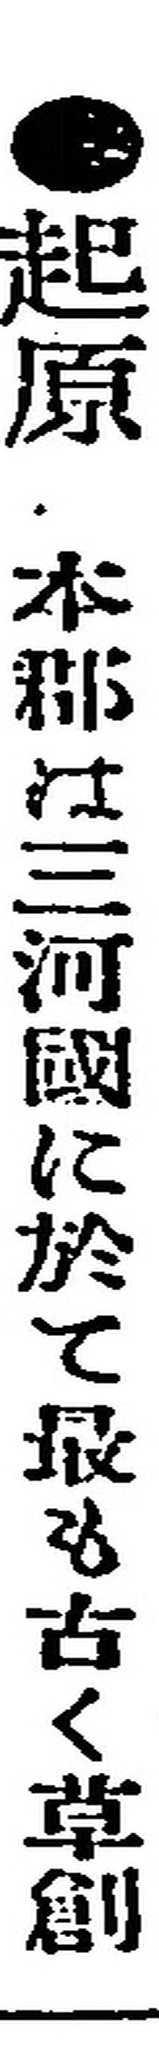●起原本郡は三河国に於て最も古く草創
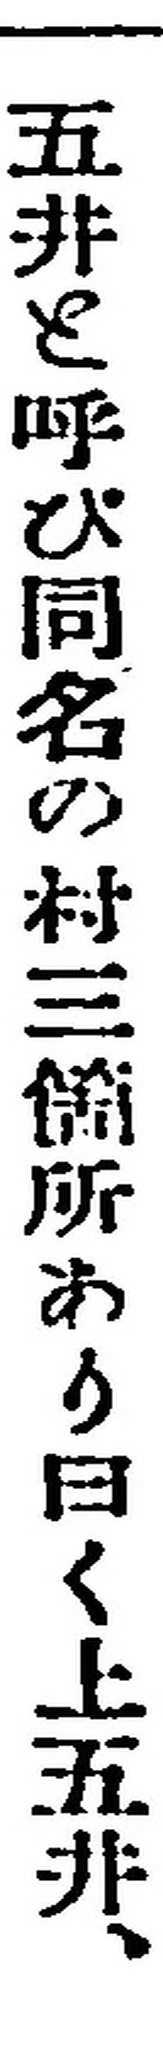五井と呼び同名の村三箇所あり曰く上五井、
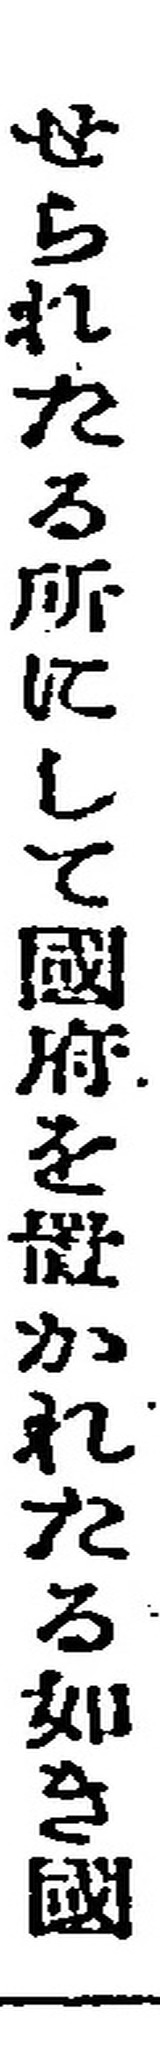せられたる所にして国府を置かれたる如き国
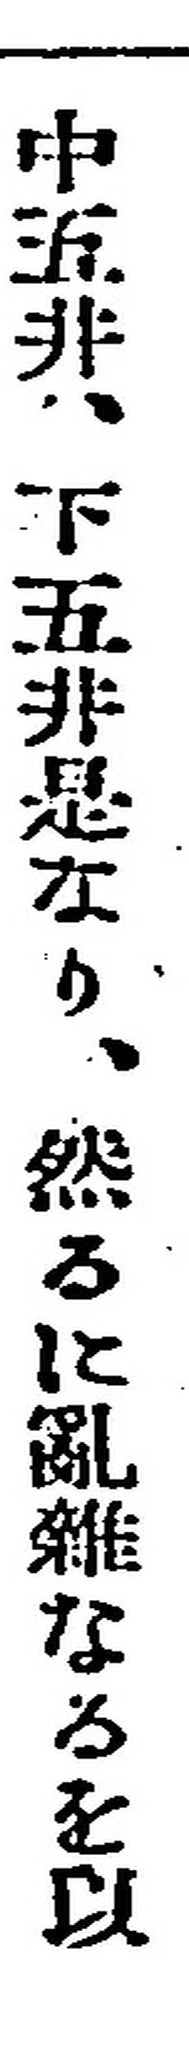中五井、下五井是なり、然るに乱雑なるを以
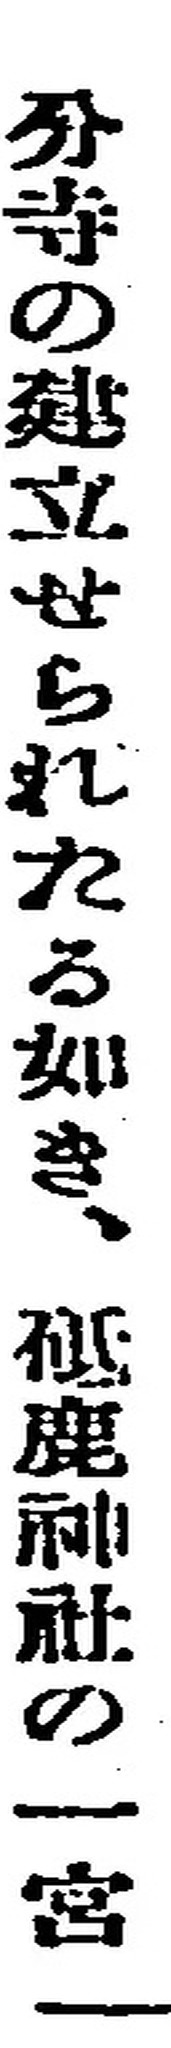分寺の建立せられたる如き、砥鹿神社の一宮
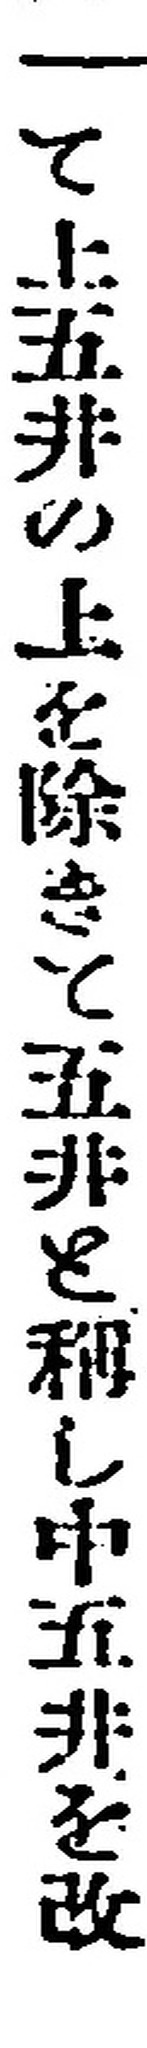て上五井の上を除きて五井と称し中五井を改
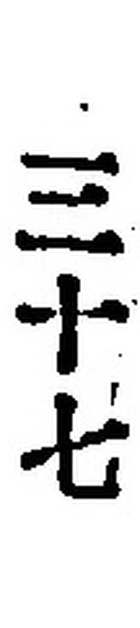三十七

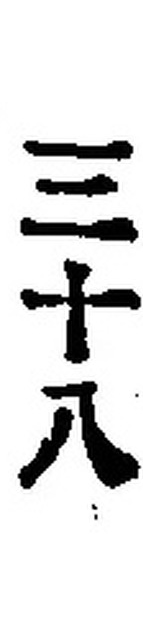三十八
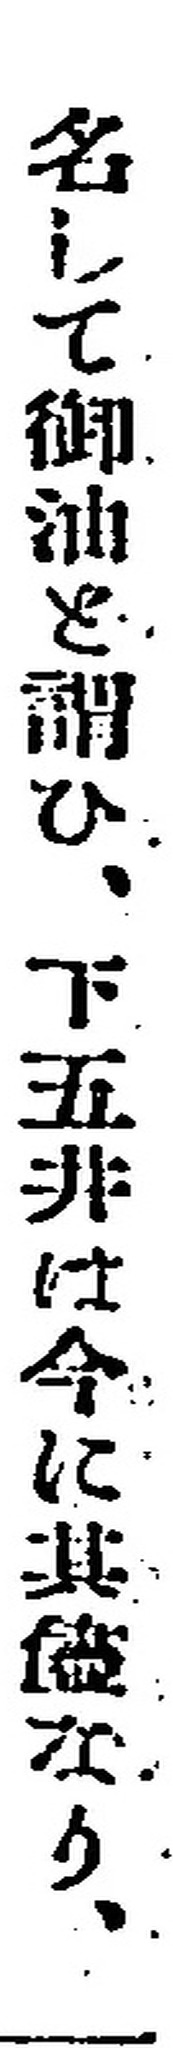名して御油と謂ひ、下五井は今に其儘なり、
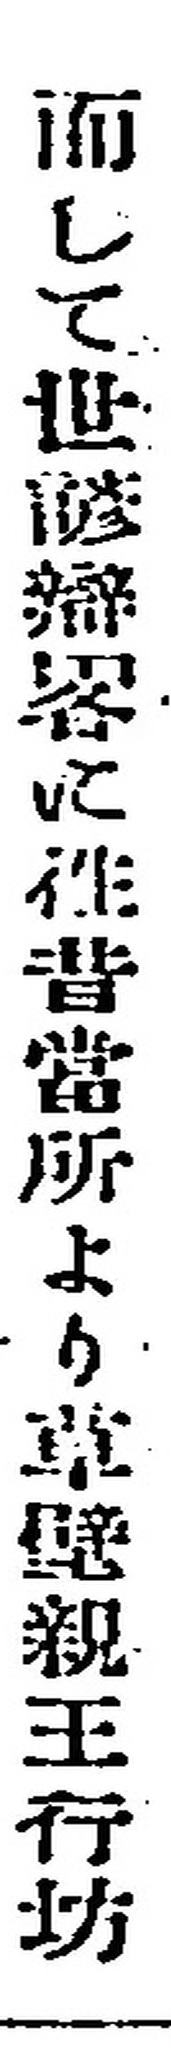而して世諺弁略に往昔当所より草壁親王行坊
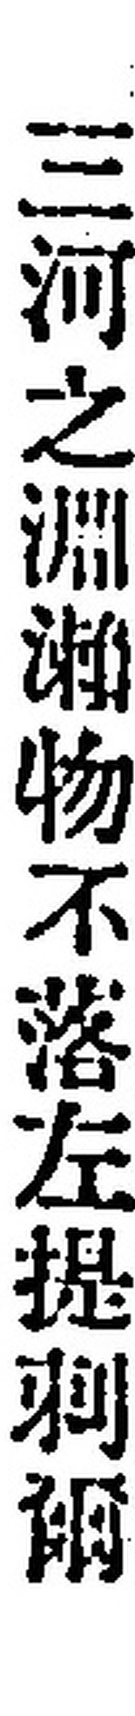三河之淵瀬物不落左提刺爾
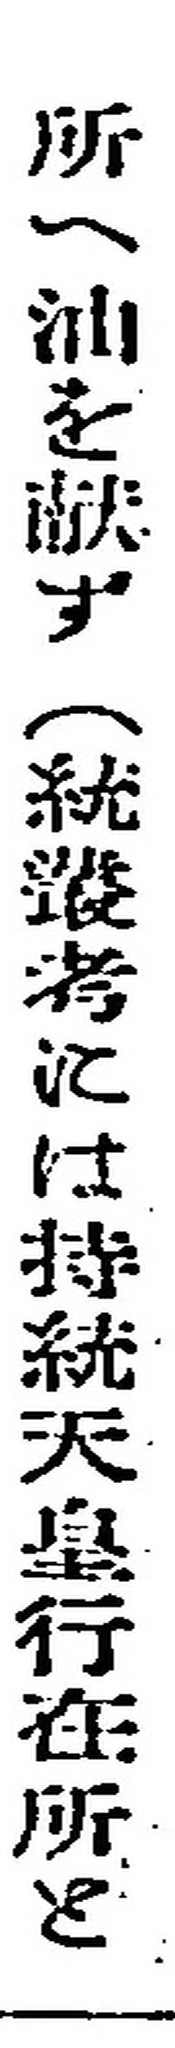所へ油を献ず(統叢考には持統天皇行在所と
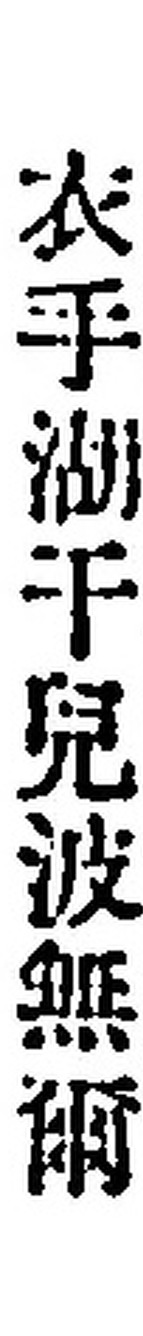衣手湖干児波無爾
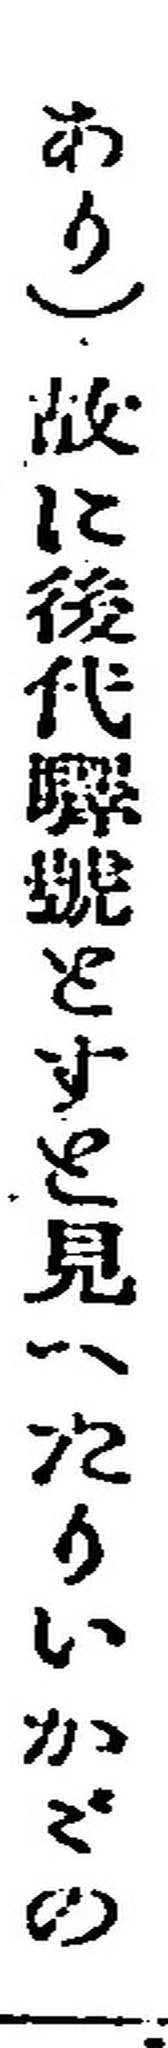あり)故に後代駅号とすと見へたりいかゞの
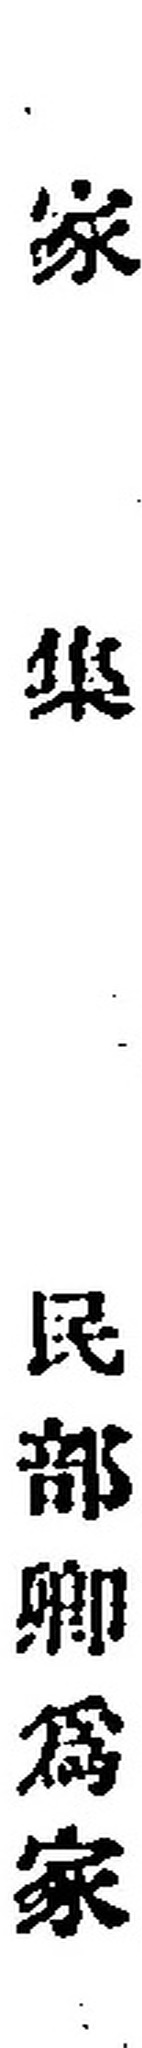家集民部卿為家
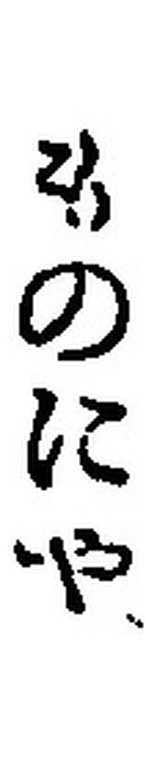ものにや
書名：東参名勝案内
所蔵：国立国会図書館 National Diet Library, JAPAN
